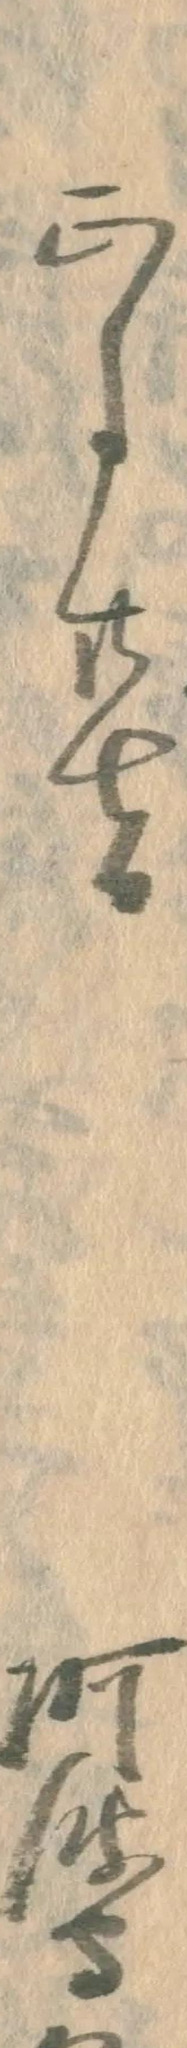正月廿七日阿波守印
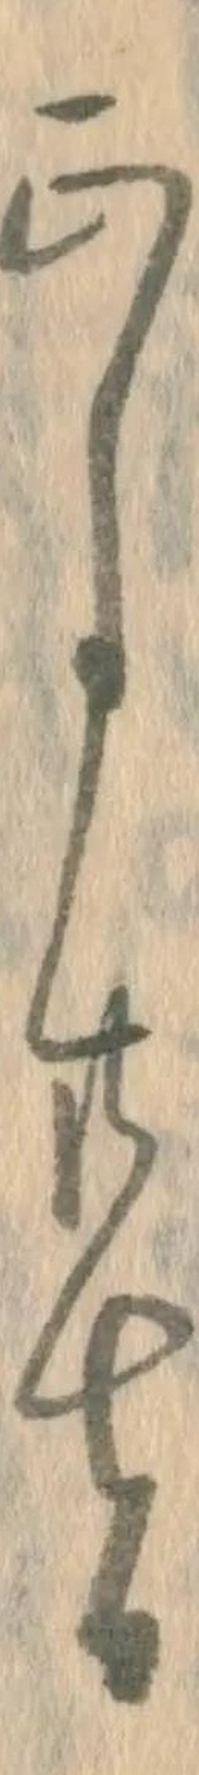正月廿七日
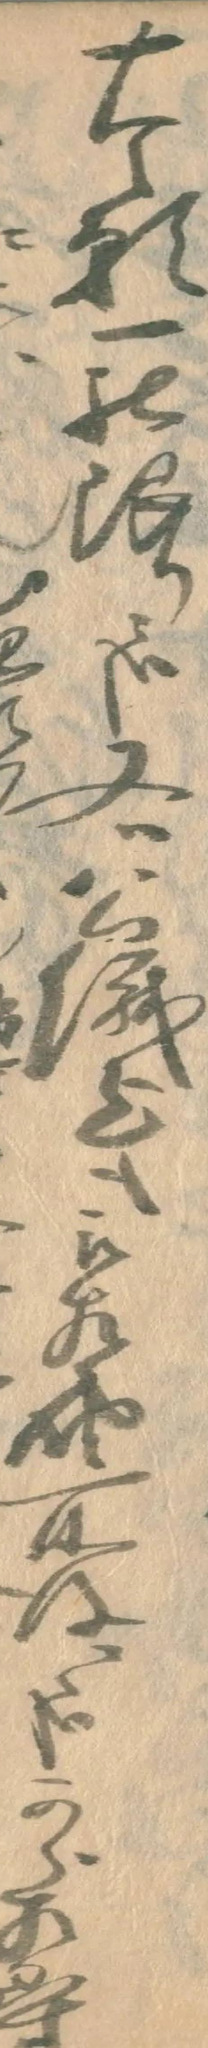右之願一社限りニ哉又ハ公儀迄も被相届所存ニ候哉可被相尋
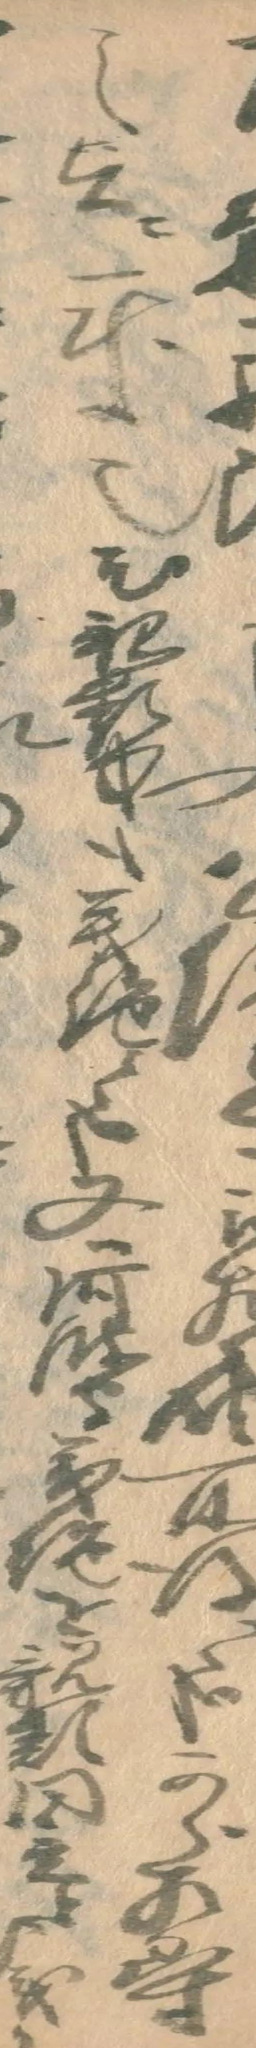之旨ニ一決也尤親類中も義絶候哉又ハ阿波守義絶を親類同意と申義か
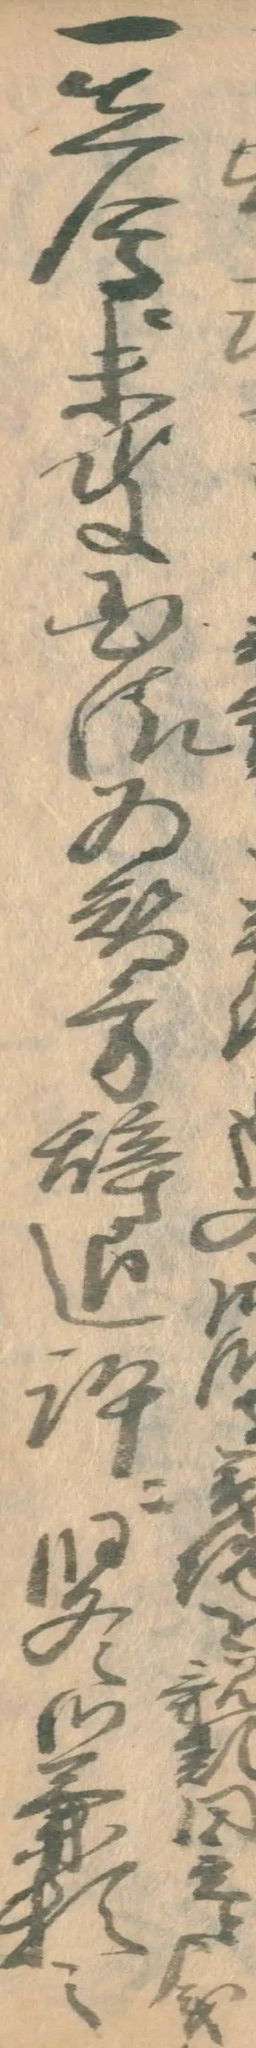一先会ニ未決国清為替方辞退評ニ旧冬御兼頼之

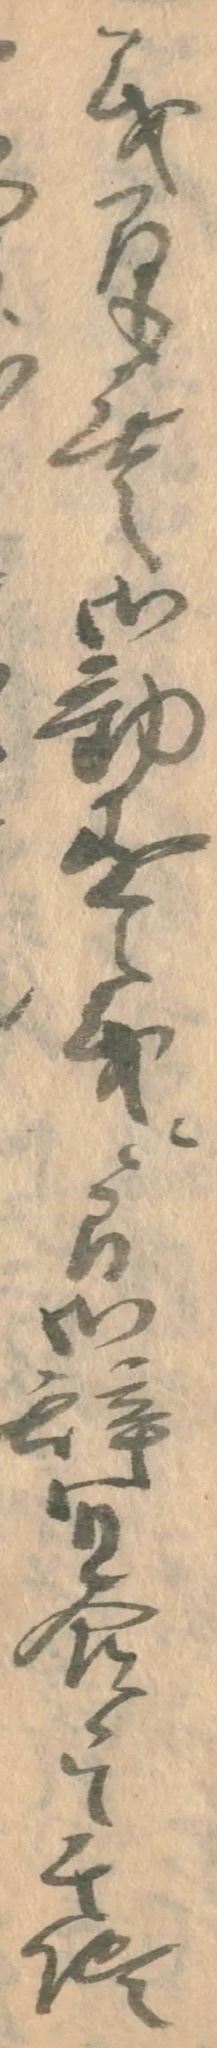義間も無之御勤懸之義ニ候間御辞宜合候ハヽ其侭
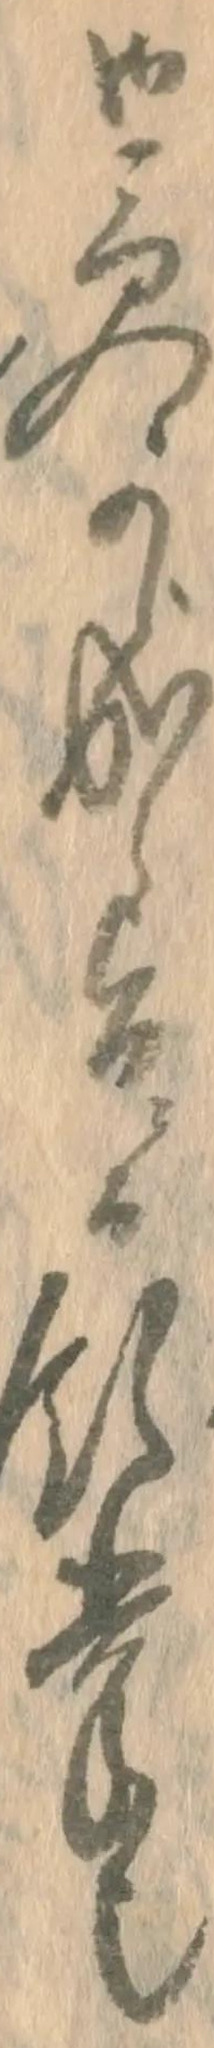御受可被成候旨ニ而領掌也
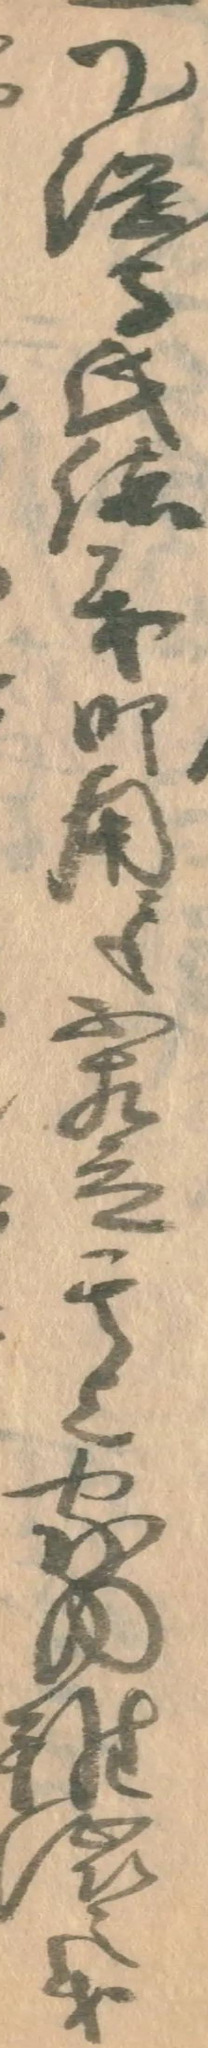一下総守氏義御用ニも不相立其上家内難渋之義
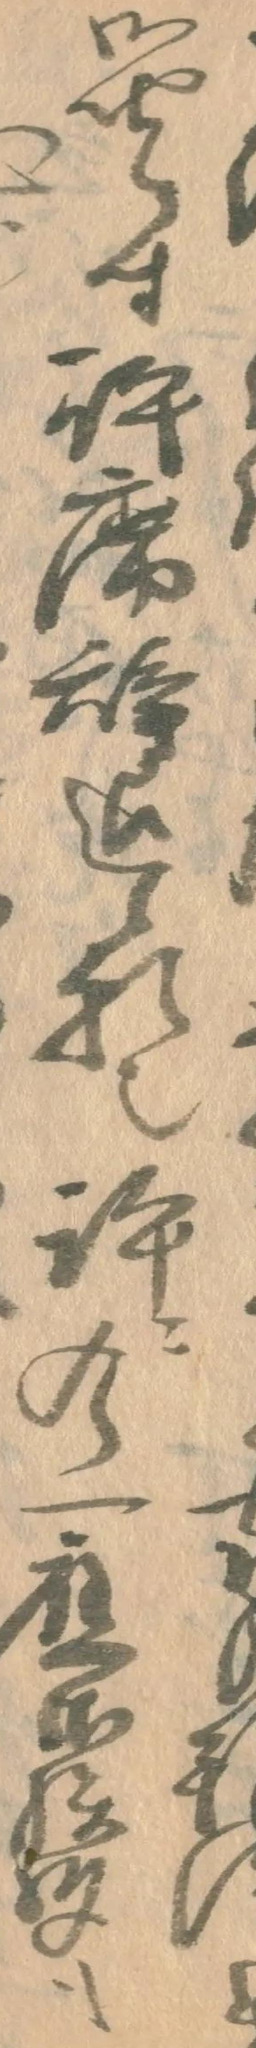御坐候付評席辞退候願也評ニ今一応御挨拶も
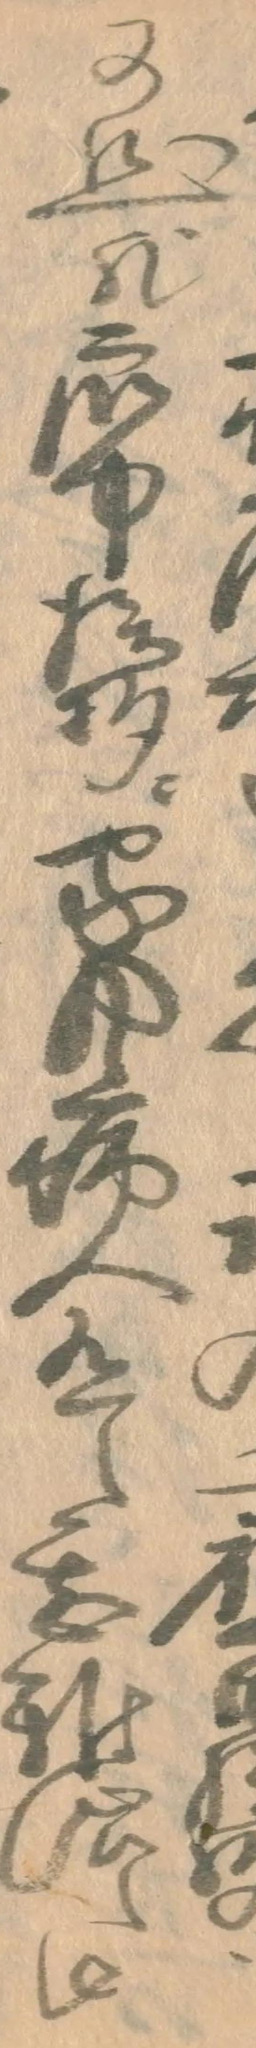可然歟衆中挨拶ニ家内病人有之甚難渋之由
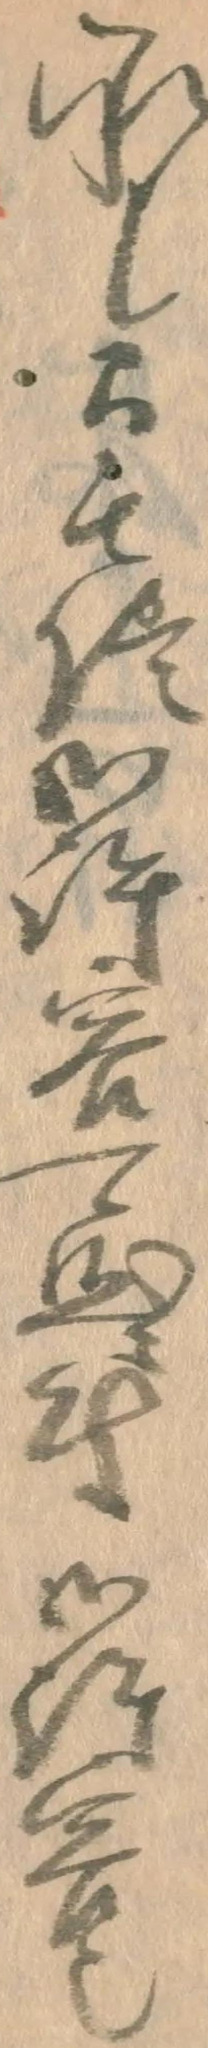承候間其儘御許容可然ニ付御許容也
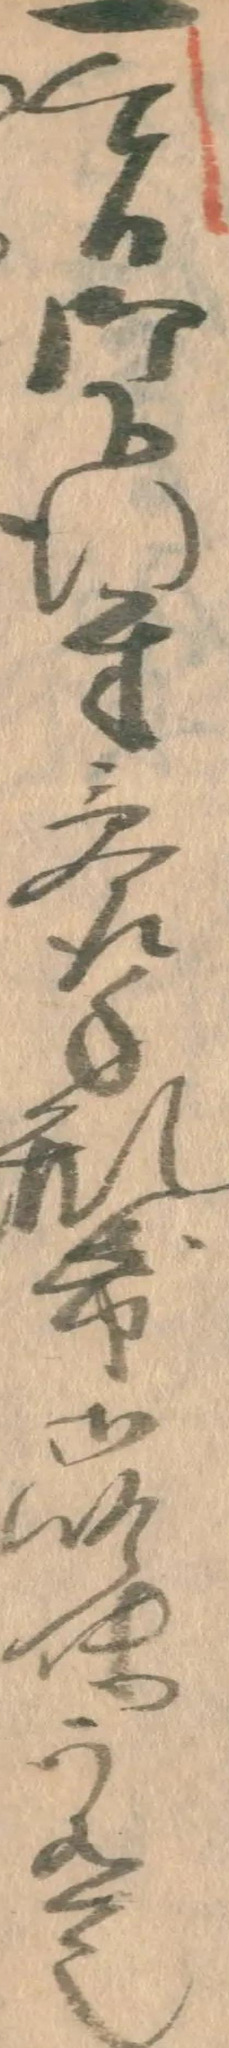一今日御下行米受取手形紙御吟味可有也
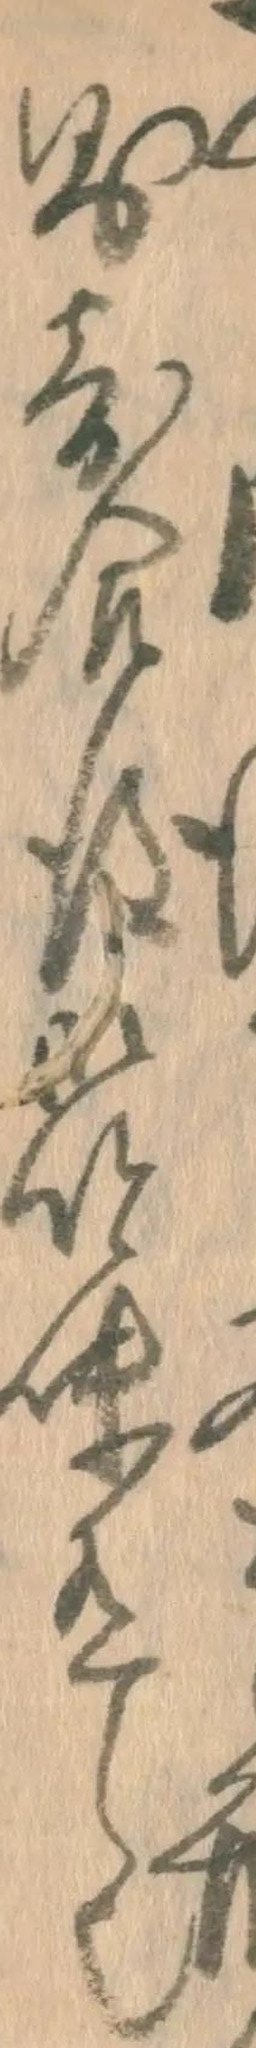則寄合後御吟味有之也
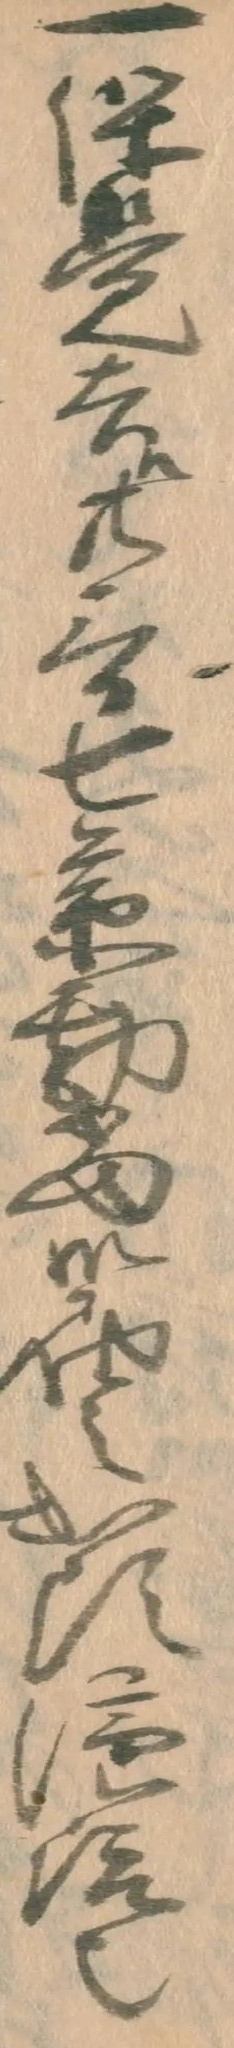一保覚去ル廿三日長兵衛勘当御届之出頭演説也
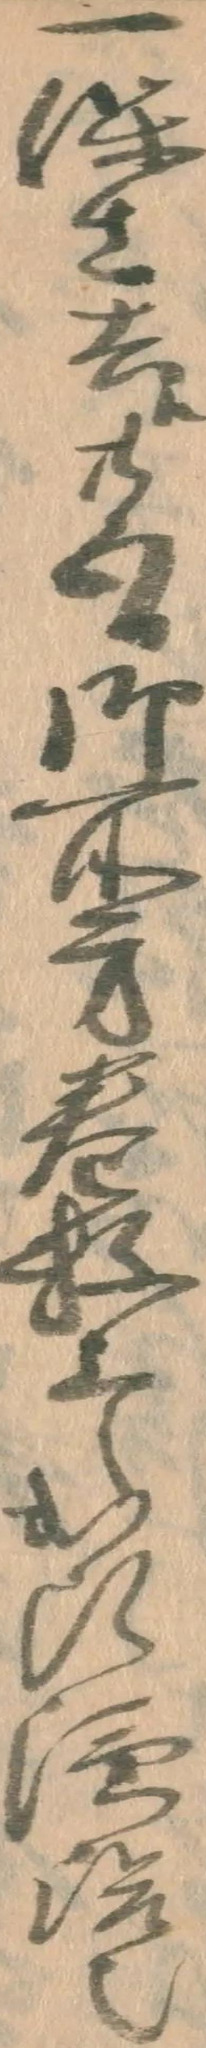一保土去ル廿五日御所方巻数上之出頭演説也
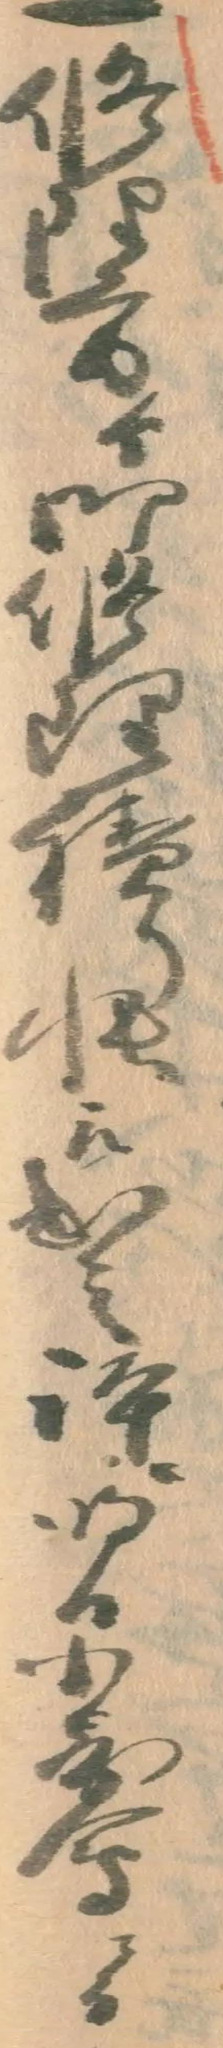一修理方ゟ御修理積り帳被出之評ニ明日小寄会ニ而
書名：賀茂社記録. 第60冊
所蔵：国立国会図書館 National Diet Library, JAPAN
